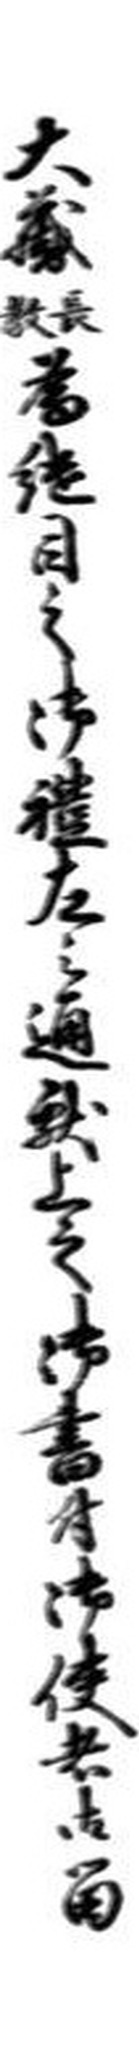教為継目之御礼左之通献上之御書付御使者御留
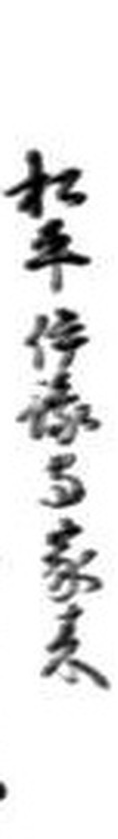松平伊予守家来
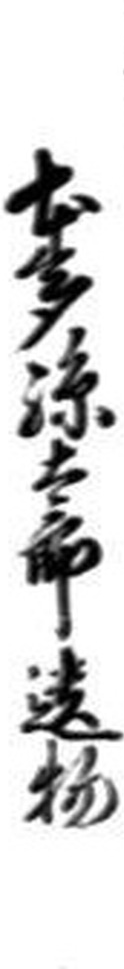本多孫太郎遺物
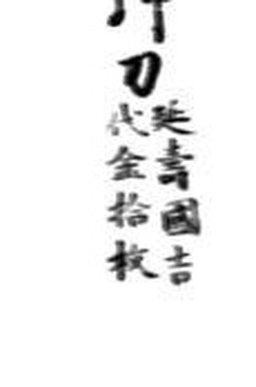代金拾枚
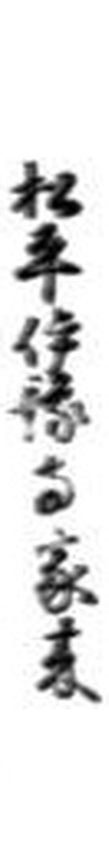松平伊予守家来

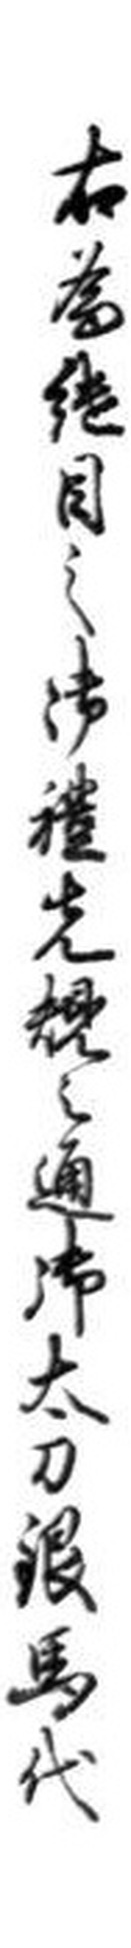右為継目之御礼先規之通御太刀銀馬代
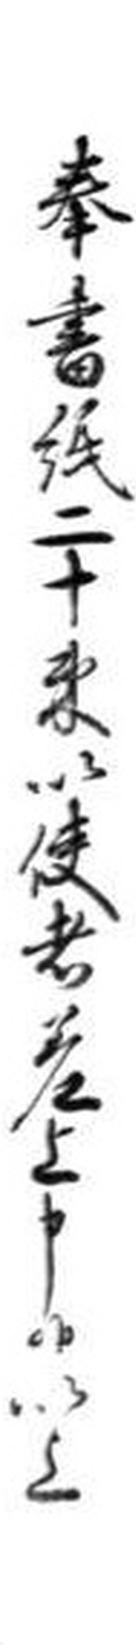奉書紙二十束以使者差上申候以上
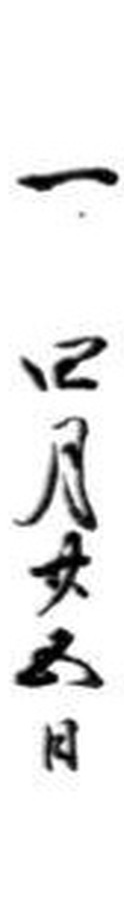一四月廿五日
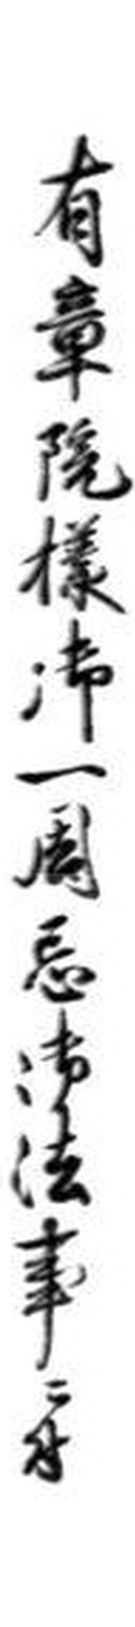有章院様御一周忌御法事ニ付
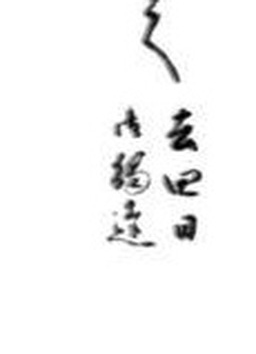御触達
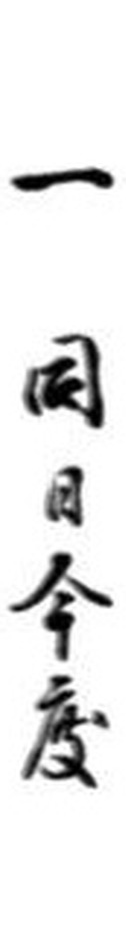一同日今度
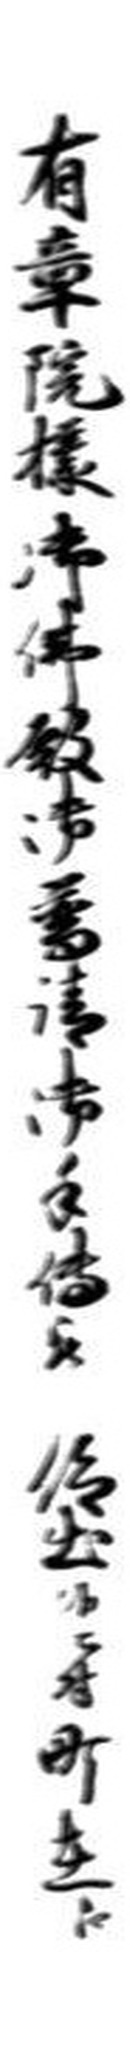有章院様御仏殿御普請御手伝被仰出候ニ付町在江
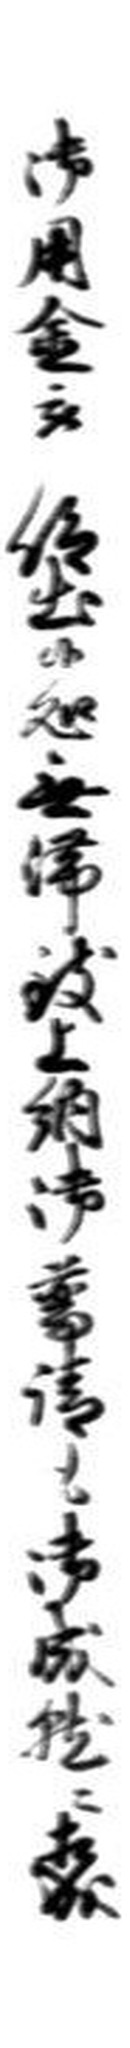御用金被仰出候処無滞致上納御普請も御成就ニ相成
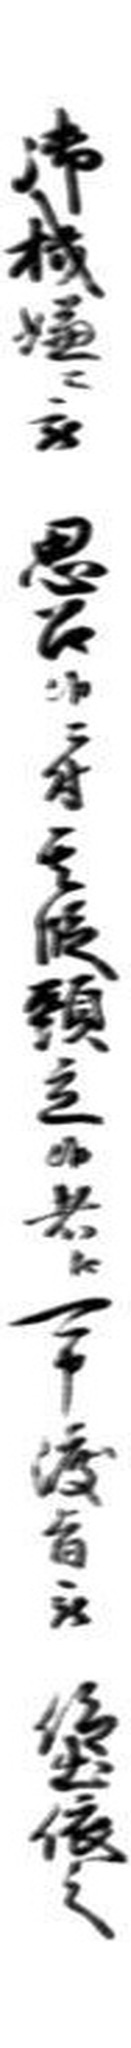御機嫌ニ被思召候ニ付其段頭立候者江可申渡旨被仰出依之
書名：家譜 三十二 吉邦公 従享保二年到享保三年
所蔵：福井県文書館 Fukui Prefectural Archives
